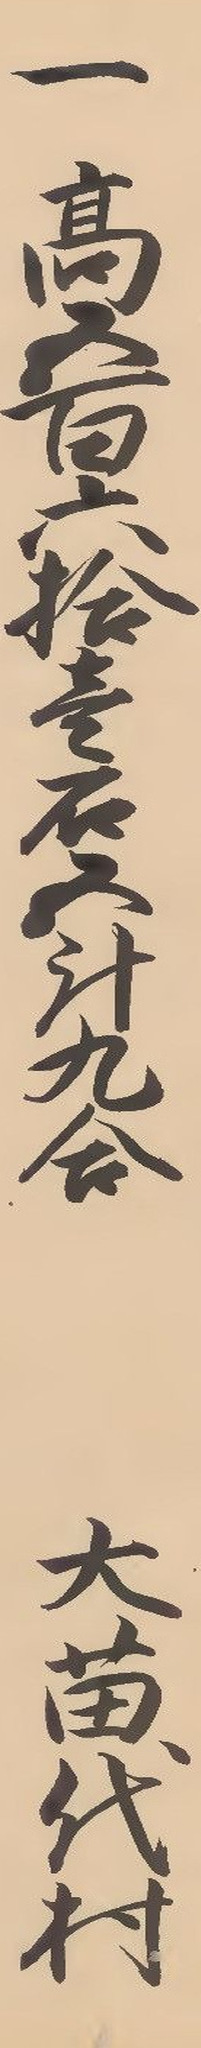一高五百六拾壱石五斗九合大苗代村
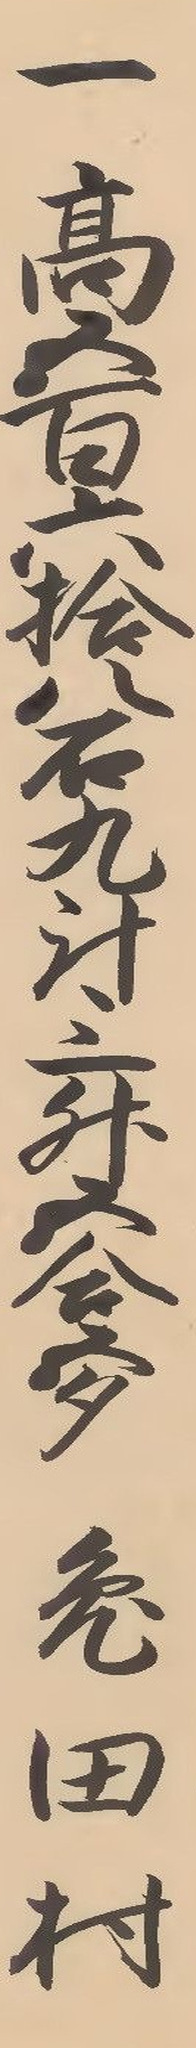一高五百六拾八石九斗三升五合五勺兎田村
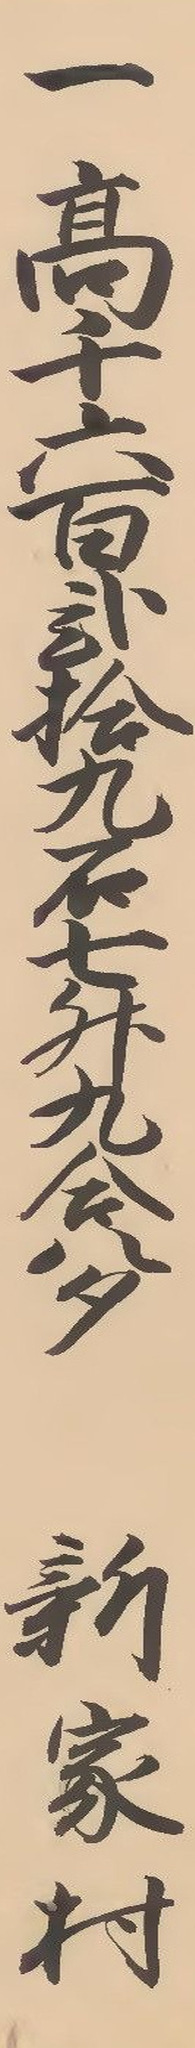一高千六百弐拾九石七升九合八勺新家村
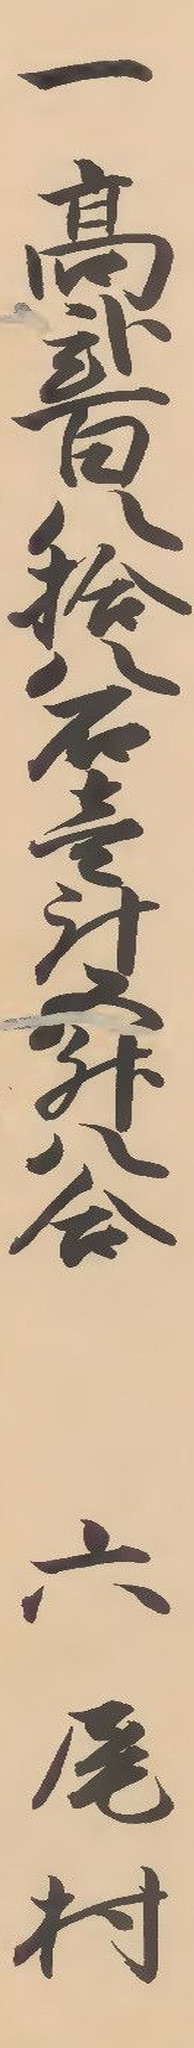一高弐百八拾八石壱斗五升八合六尾村

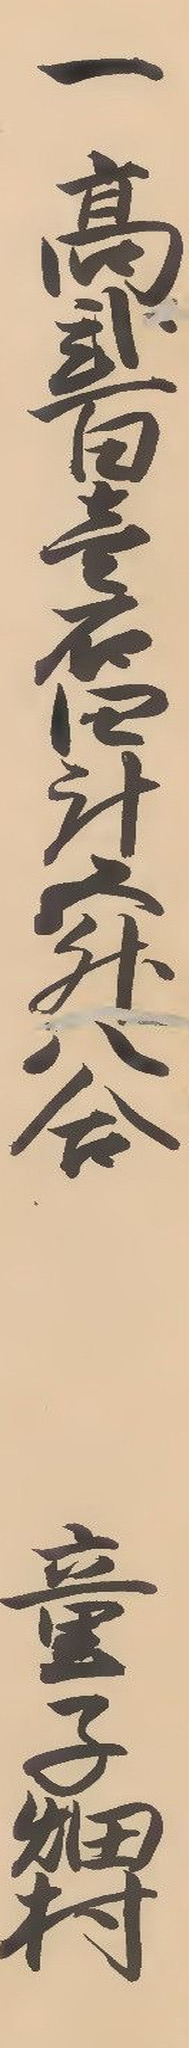一高弐百壱石四斗五升八合童子畑村
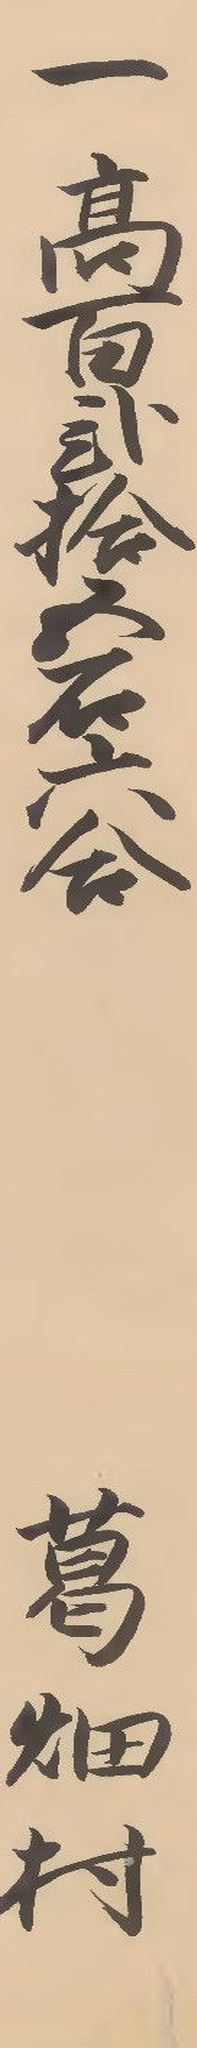一高百弐拾五石六合葛畑村
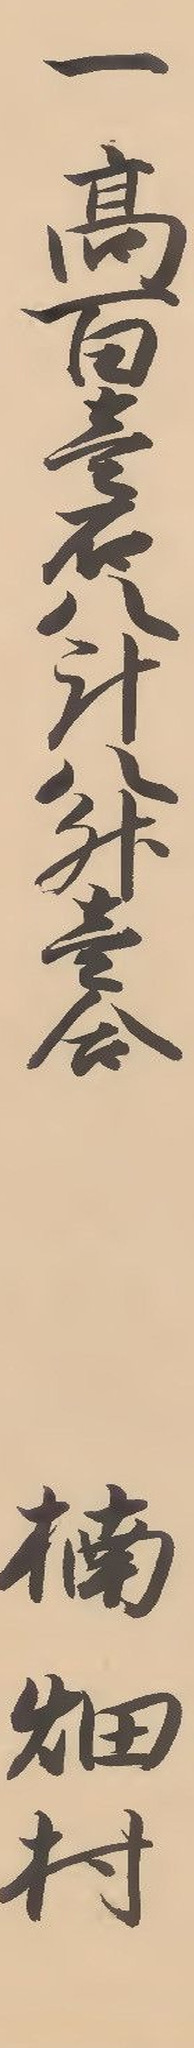一高百壱石八斗八升壱合楠畑村
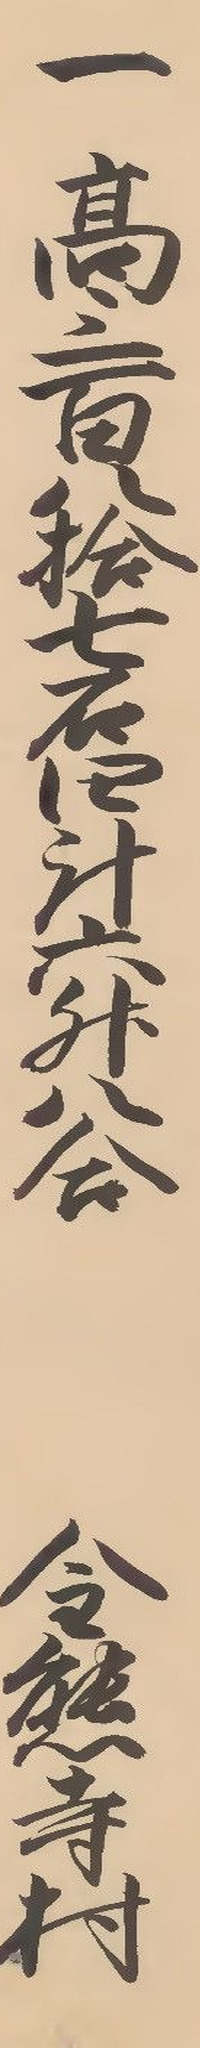一高三百八拾七石四斗六升八合金熊寺村
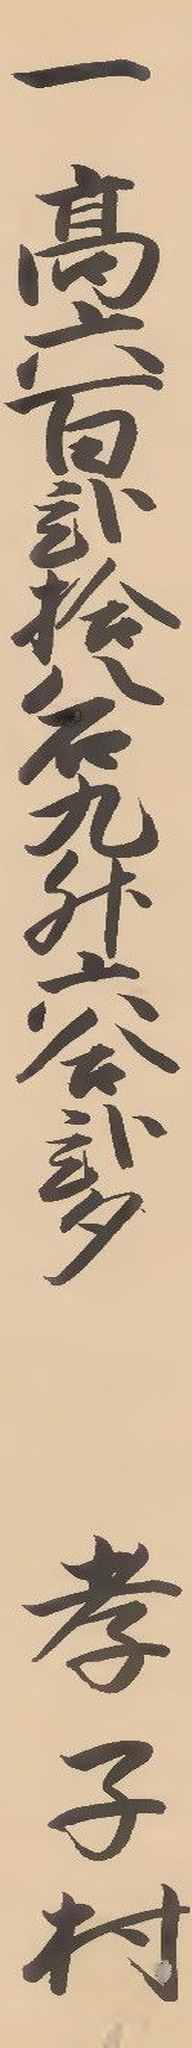一高六百弐拾八石九升六合弐勺孝子村
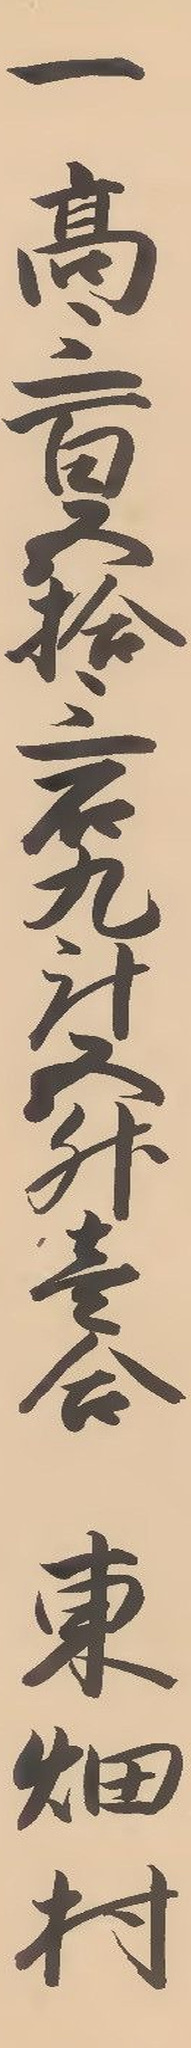一高三百五拾三石九斗五升壱合東畑村
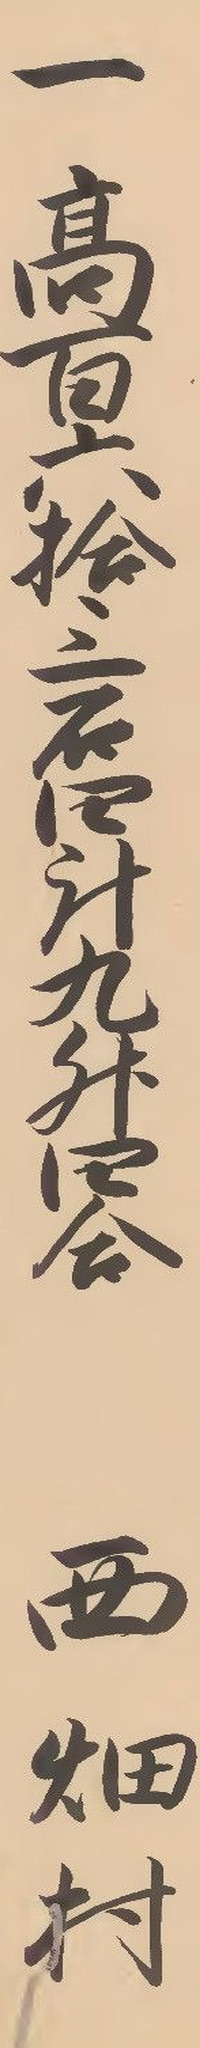一高百六拾三石四斗九升四合西畑村
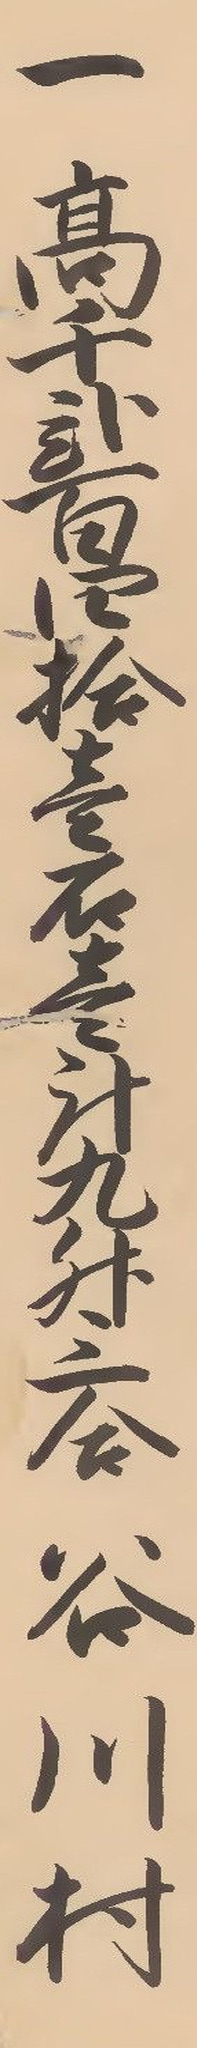一高千弐百四拾壱石壱斗九升三合谷川村

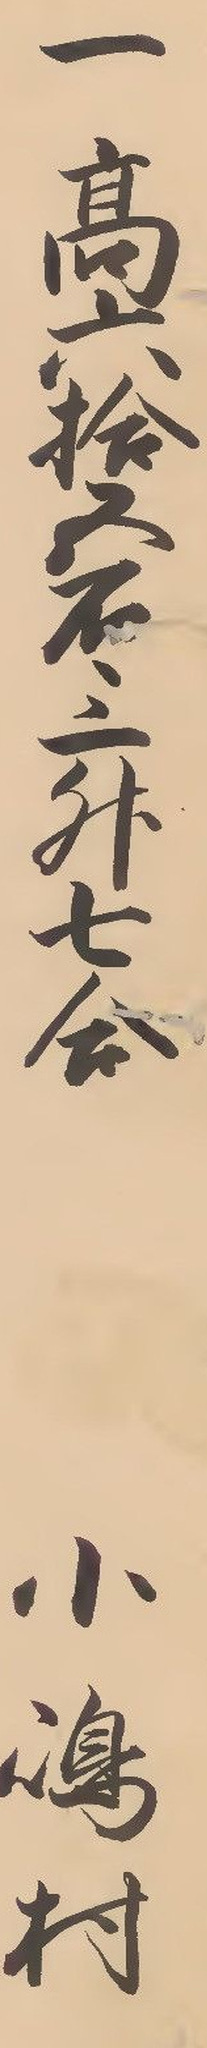一高六拾五石三升七合小島村
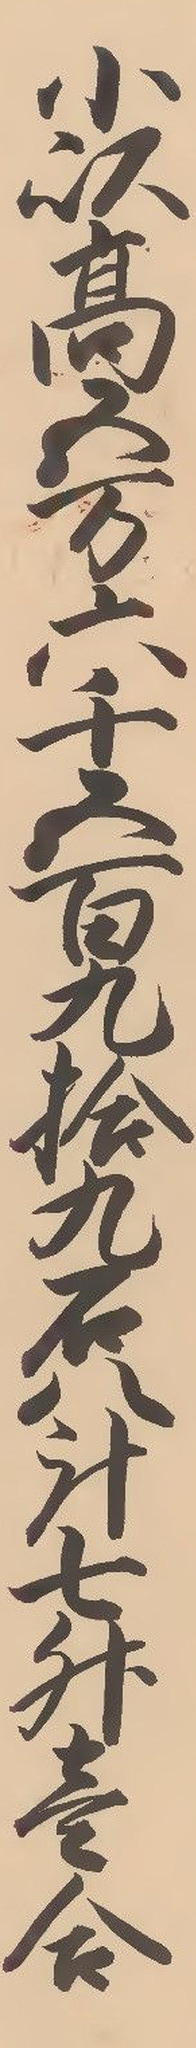小以高五万六千五百九拾九石八斗七升壱合
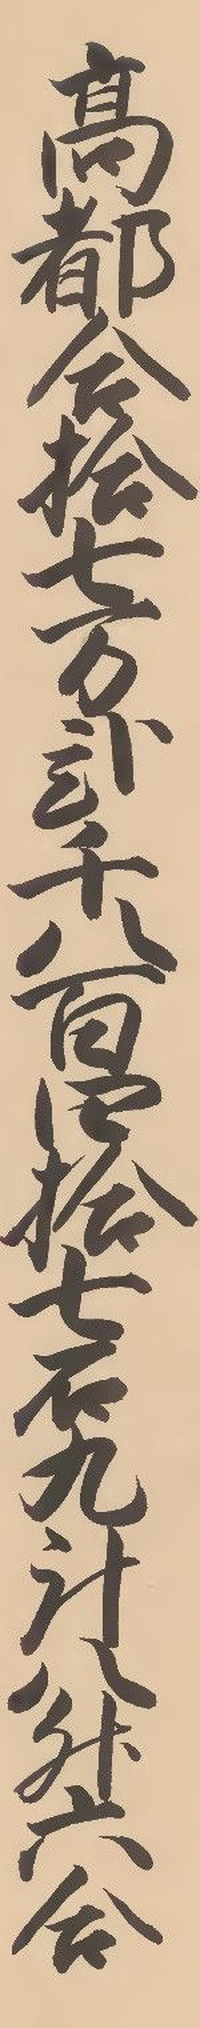高都合拾七万弐千八百四拾七石九斗八升六合
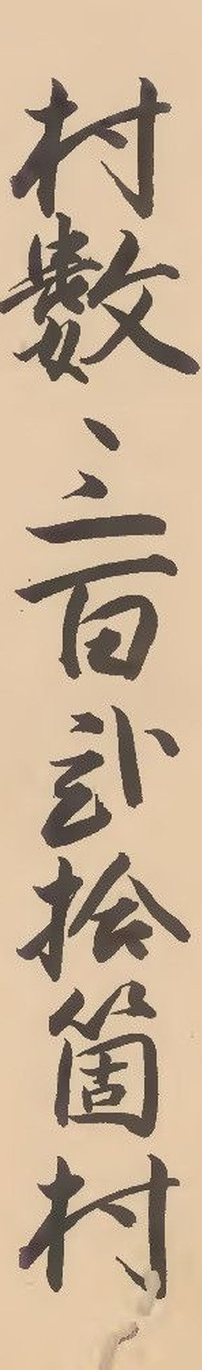村数三百弐拾箇村
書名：和泉国郷帳
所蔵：国立公文書館 National Archives of Japan
